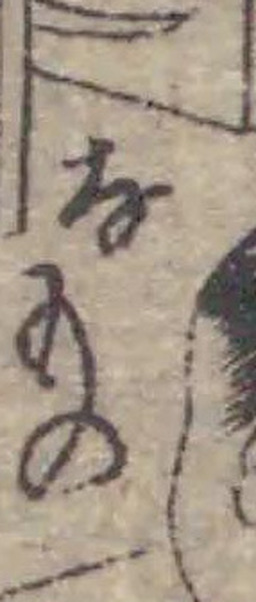なもの

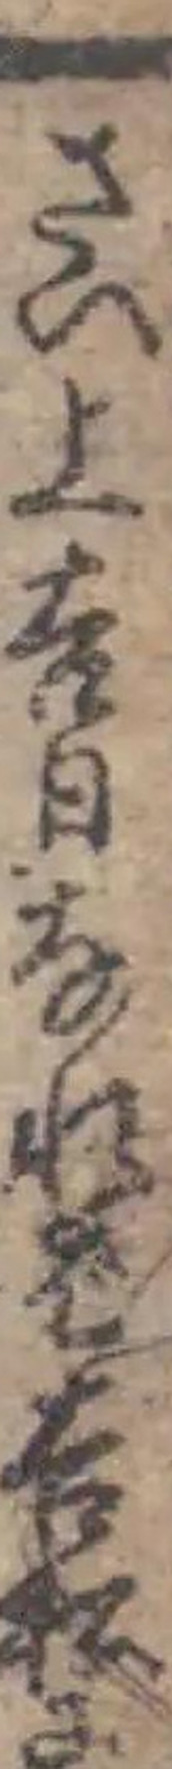さい上吉日なれば吉松に
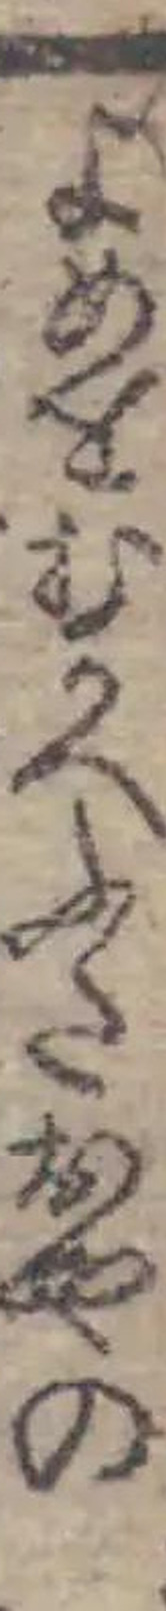よめをむかへふたおやの
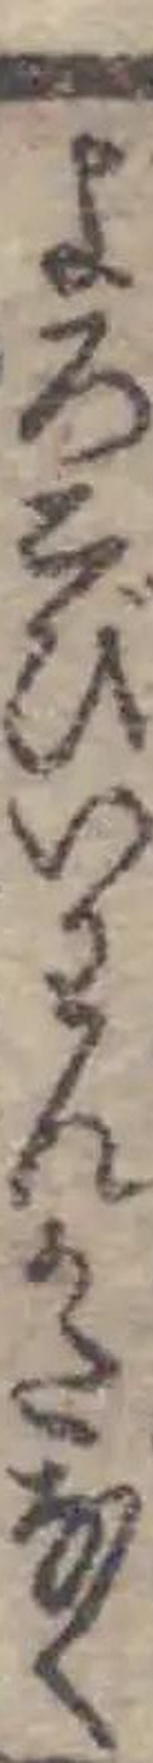よろこびいわんかたなく
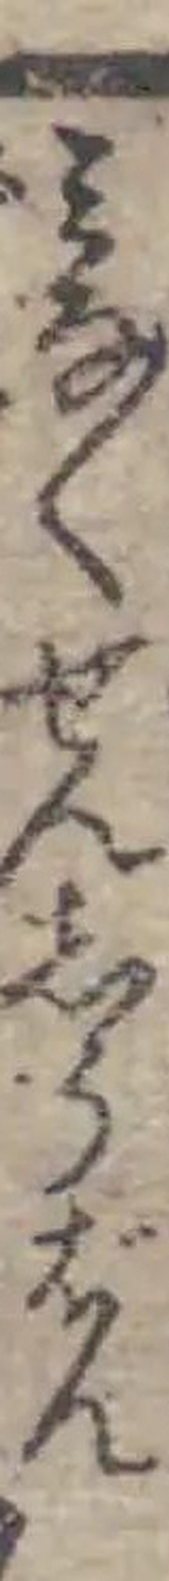みな〳〵せんしうばん
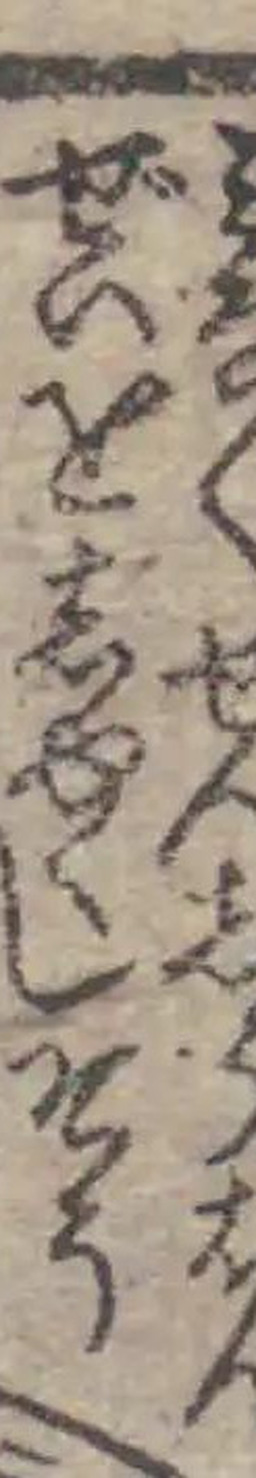ぜいをしゆくしそう
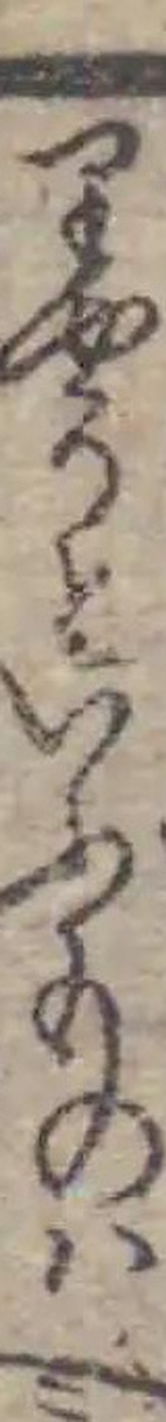りやうといふものは
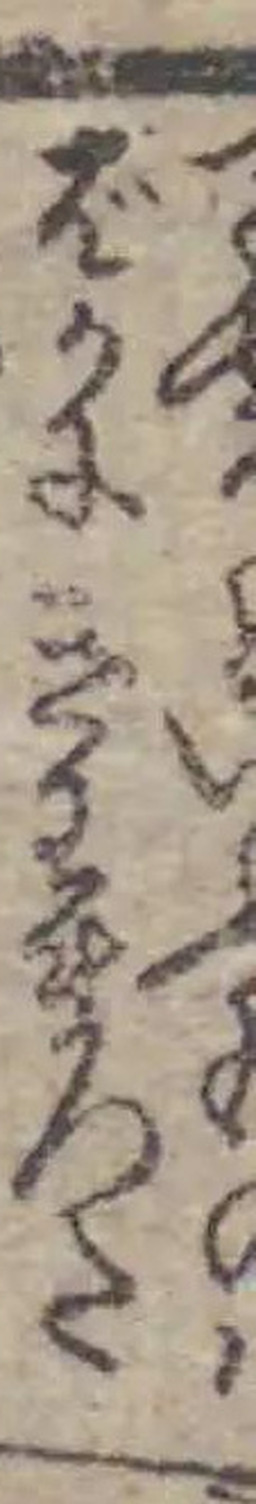ばかにきわまつた
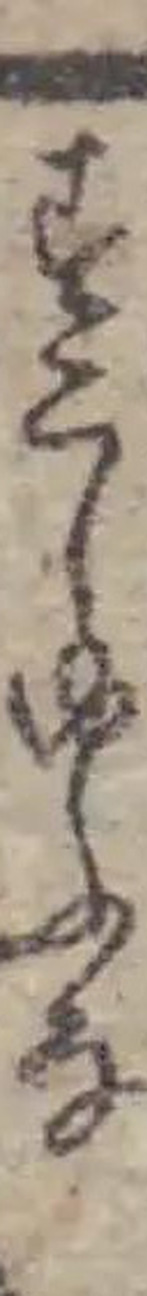すこしゆふな
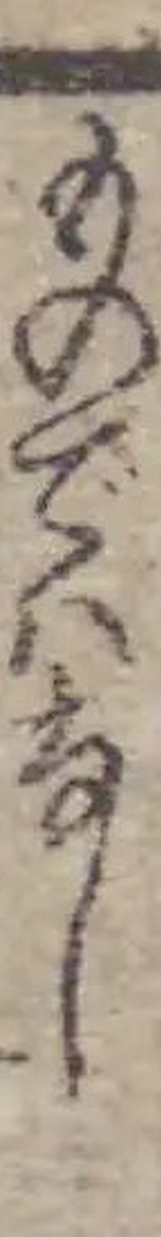ものではなし
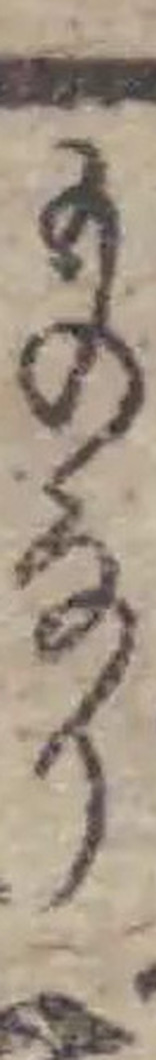ものなり
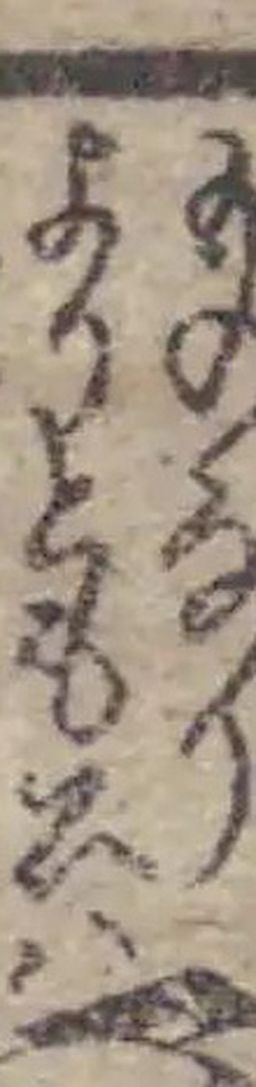よりとも公は
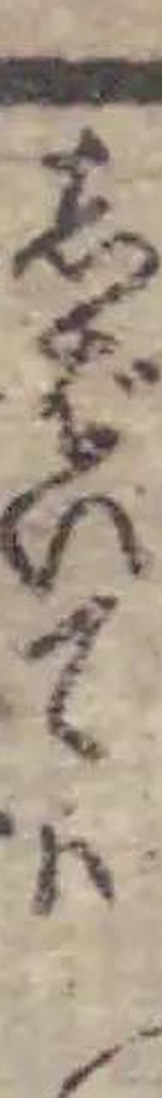しばいては
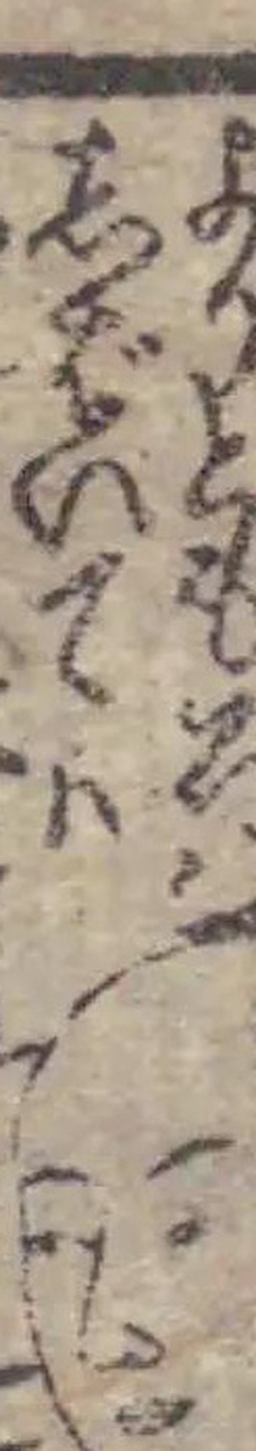しばいては
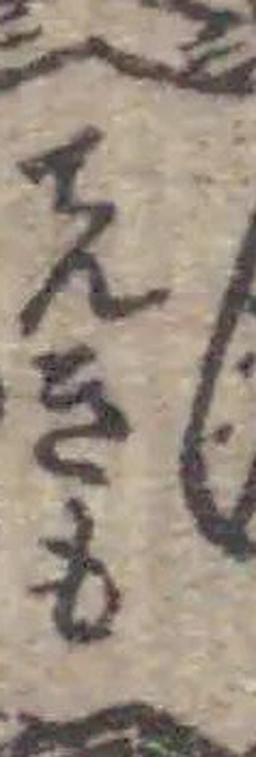てんきも
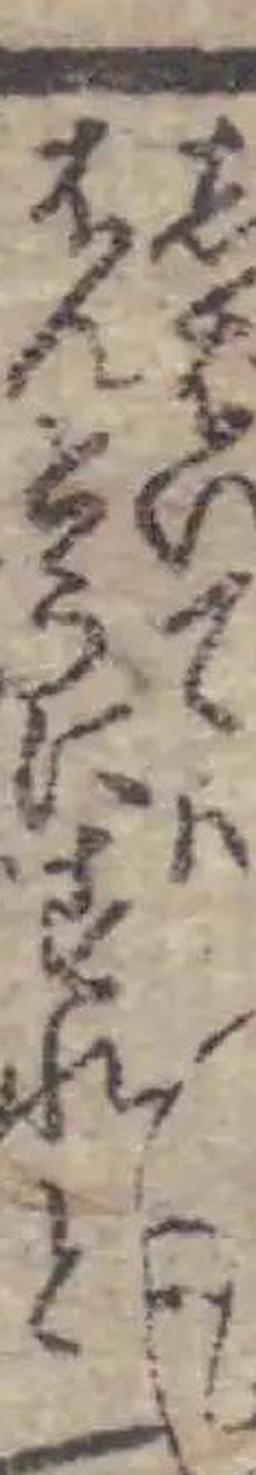はんとうにすれと
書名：津以曽無弟の甚六 3巻
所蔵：国立国会図書館 National Diet Library, JAPAN
